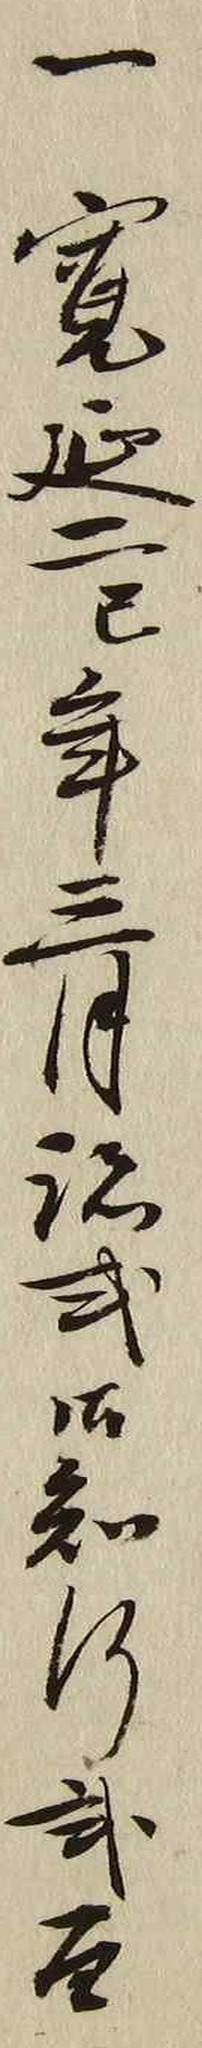一寛延二巳年三月跡式御知行弐百
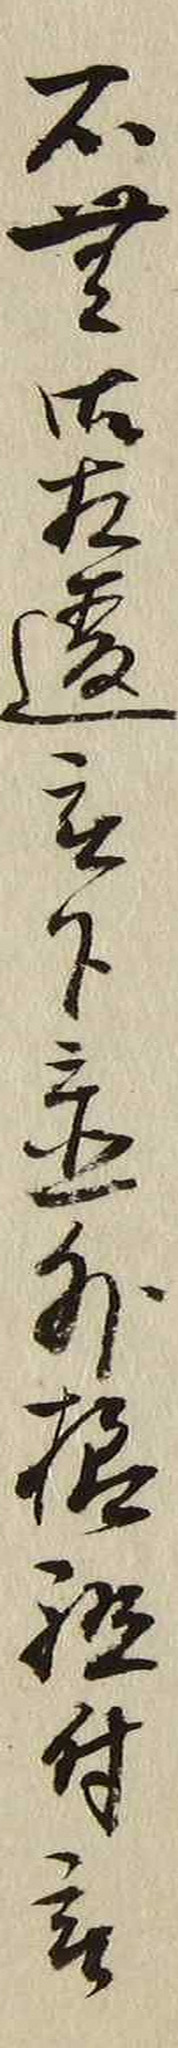石無御相違被下置外様組付被
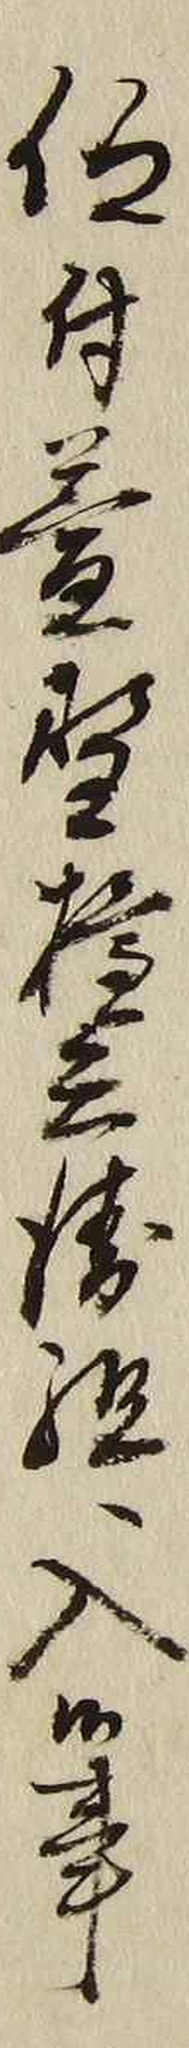仰付萱野権兵衛組へ入候事
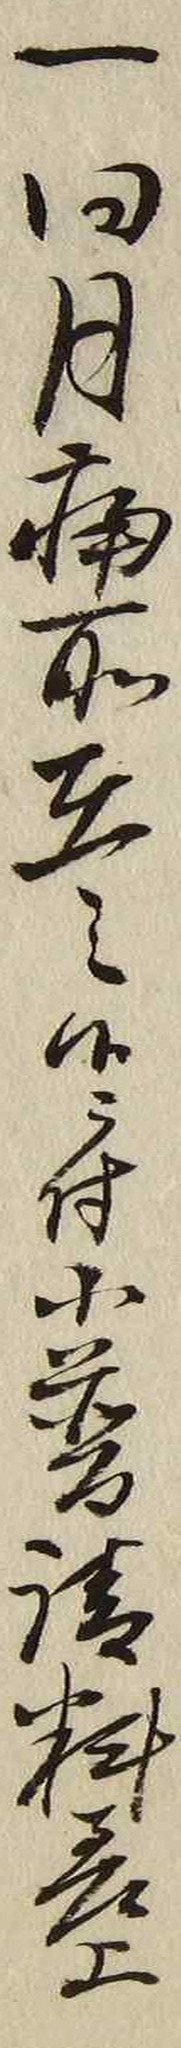一同月痛所在之候ニ付小普請料差上
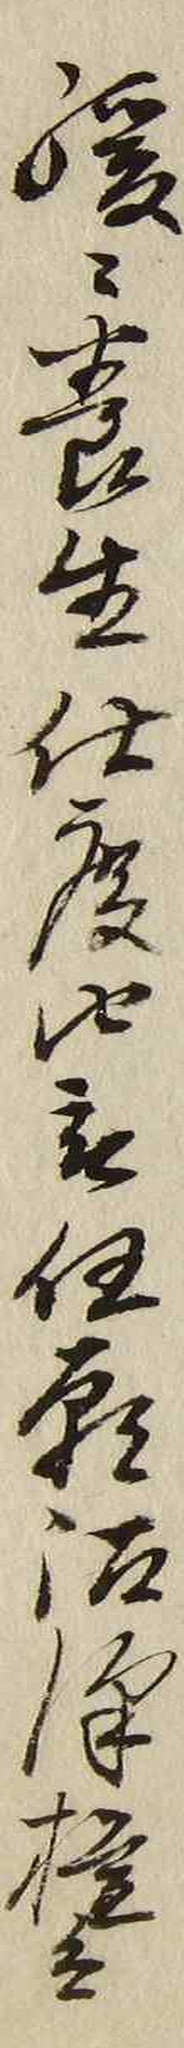後ニ養生仕度由被任願沼沢権兵

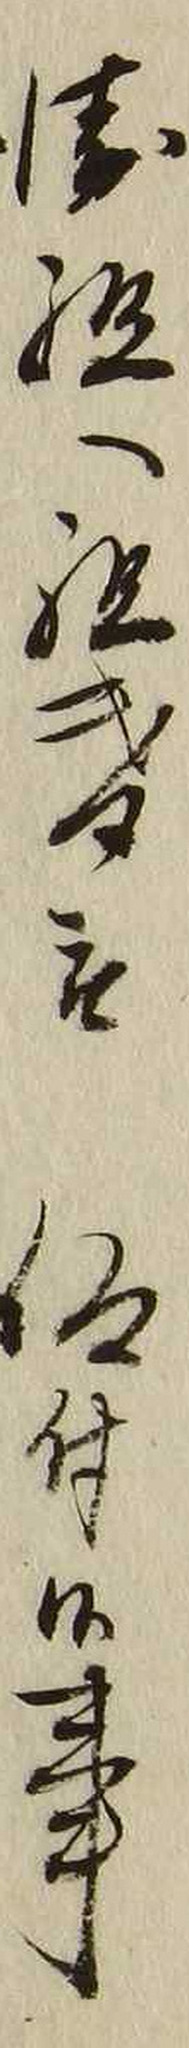衛組へ組替被仰付候事
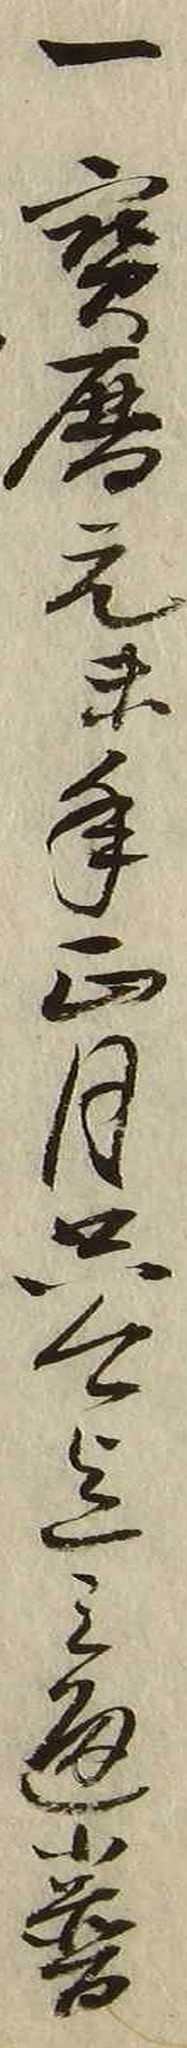一宝暦元未年正月只今迄之通小普
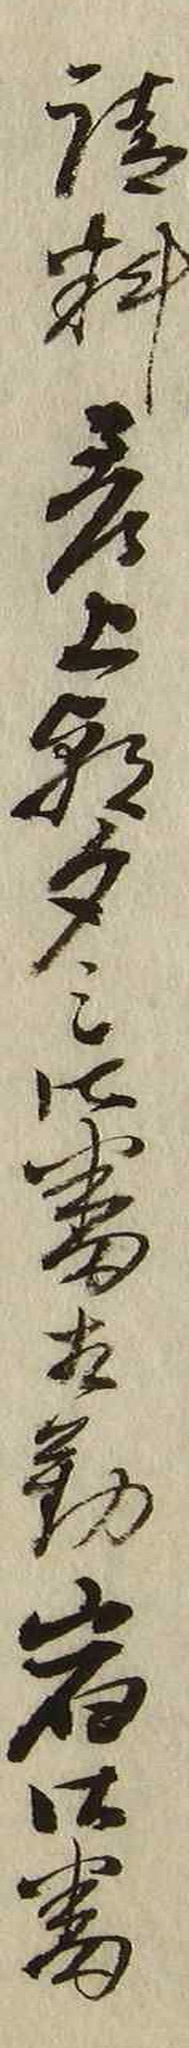請料差上朝夕之御番相勤宿御番
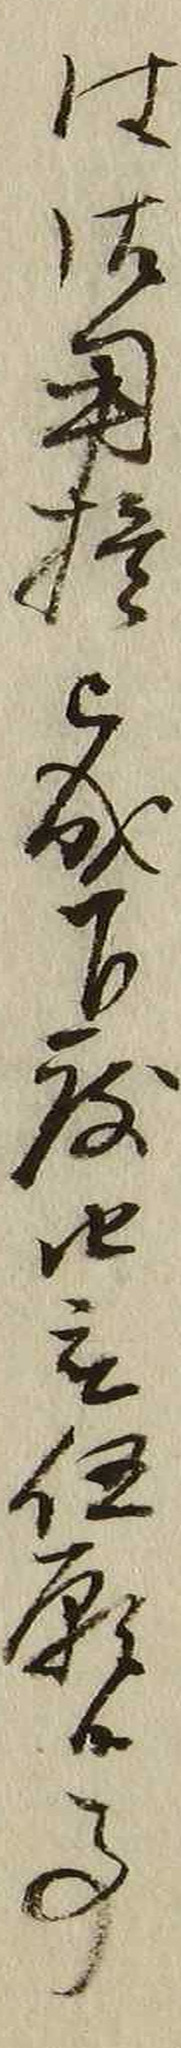は御用捨被成下度由被任願候事
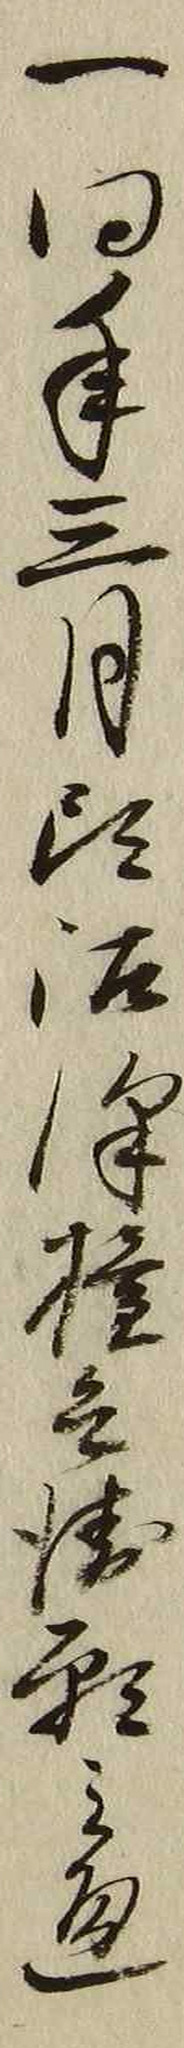一同年三月頭沼沢権兵衛願之通
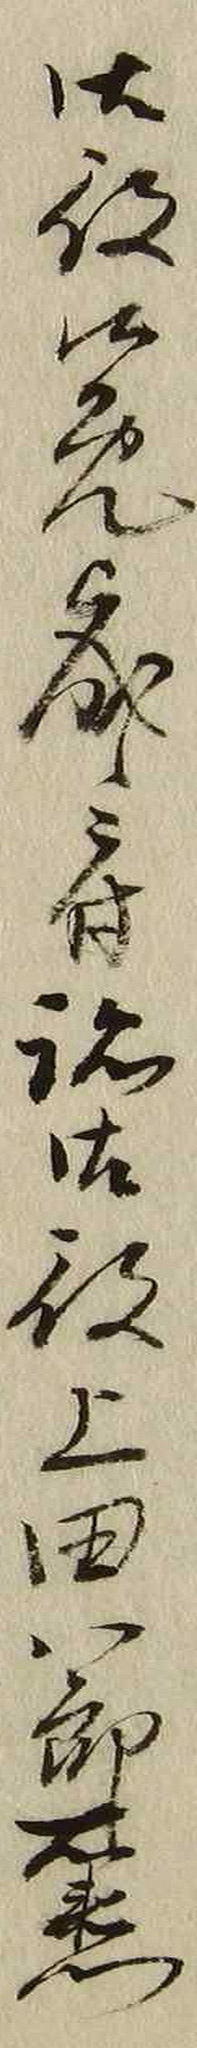御役御免被成候ニ付跡御役上田八郎右衛門
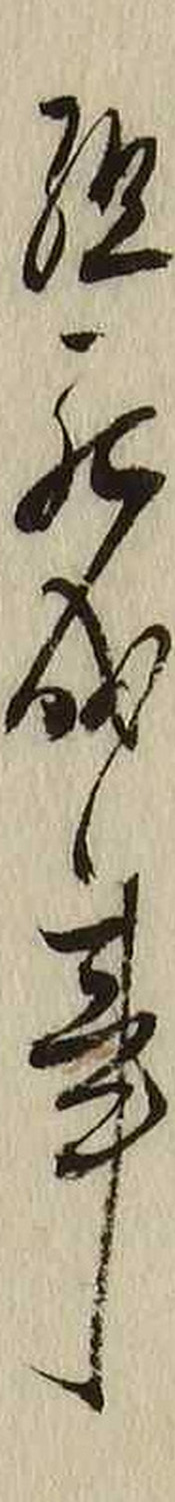組罷成候事
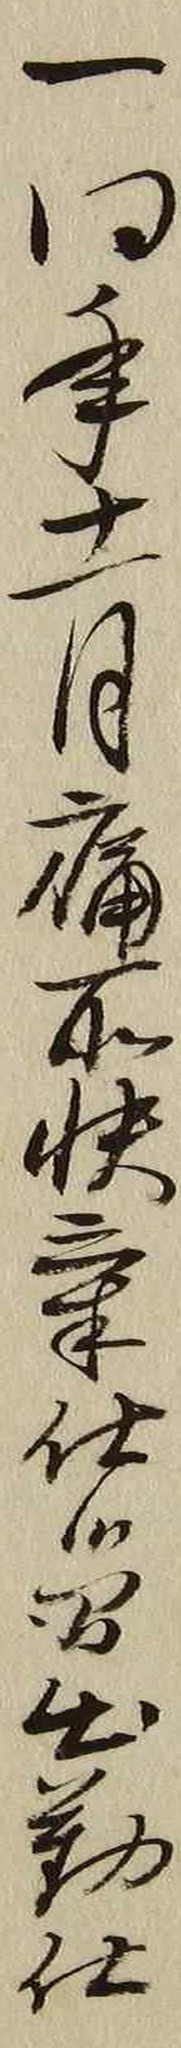一同年十一月痛所快気仕候間出勤仕
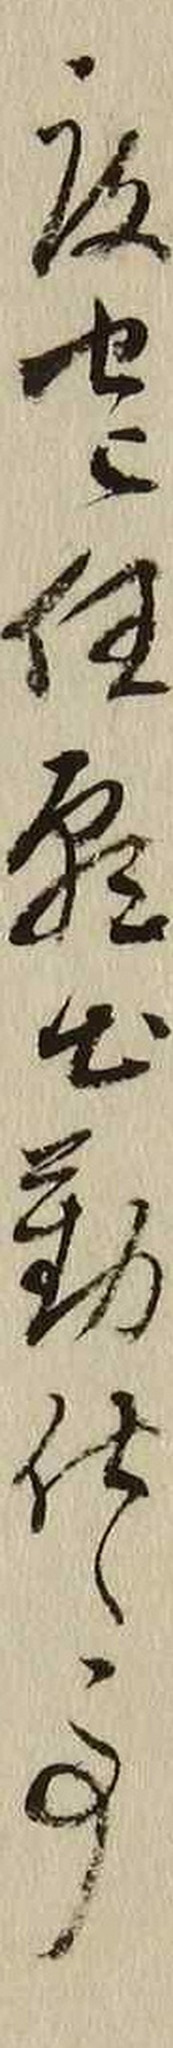度由被任願出勤仕候事
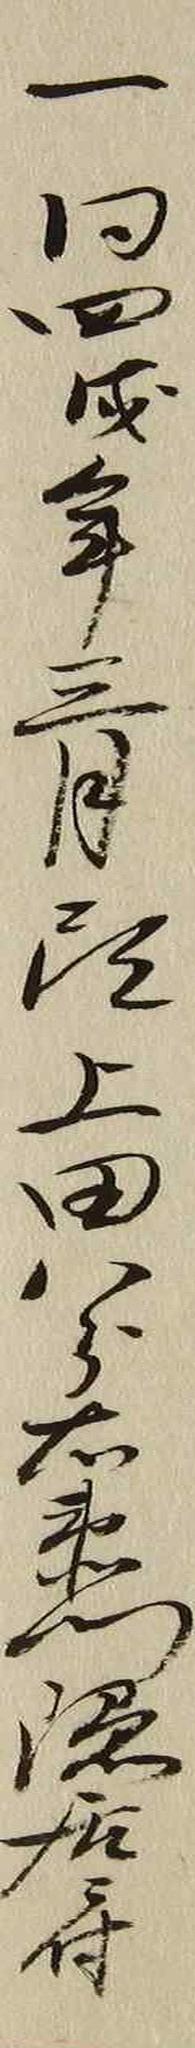一同四戌年三月頭上田八郎右衛門隠居ニ付
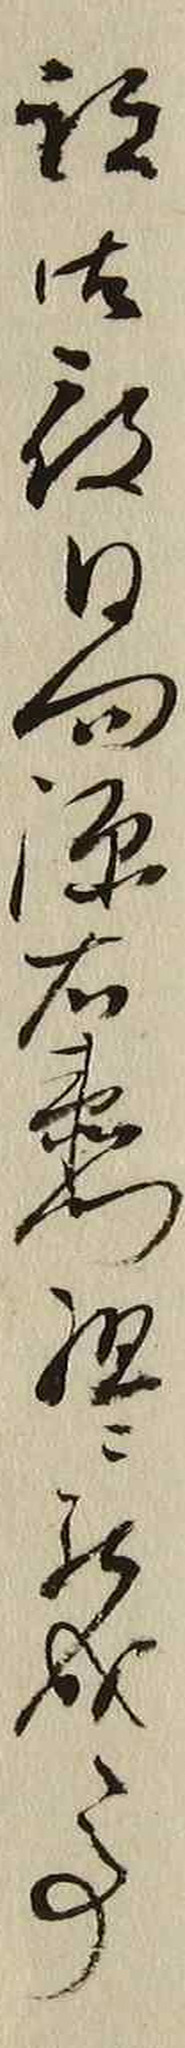跡御役日向源右衛門組ニ罷成候事
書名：諸士系譜　巻之352　す之部2
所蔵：会津若松市立会津図書館
